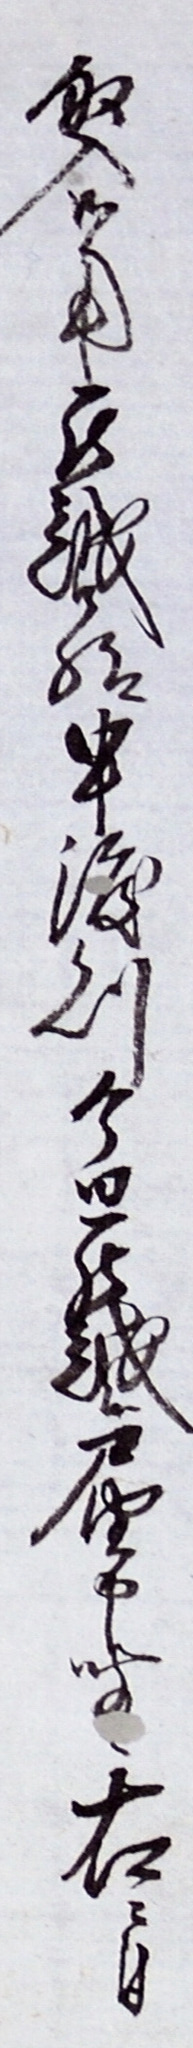取入御用罷越候様申渡則今日罷越候届申聞右ニ付
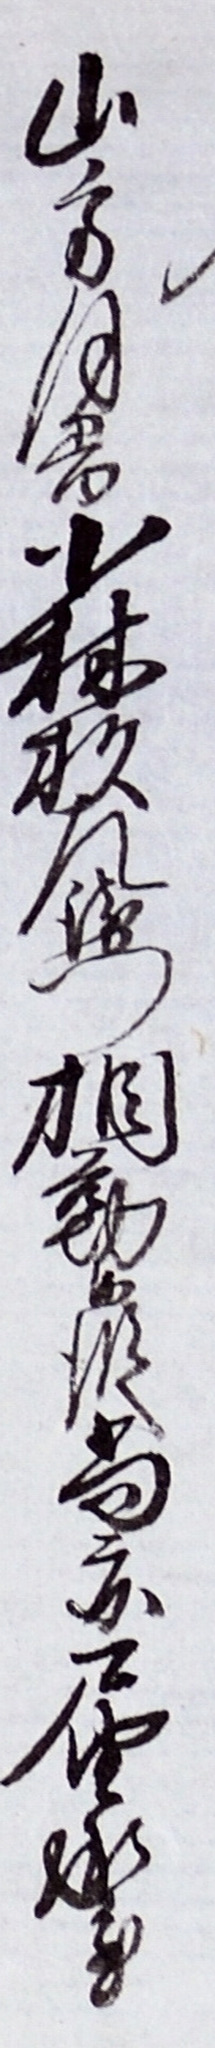山方月番小林杉左衛門相勤候様尚又届承置
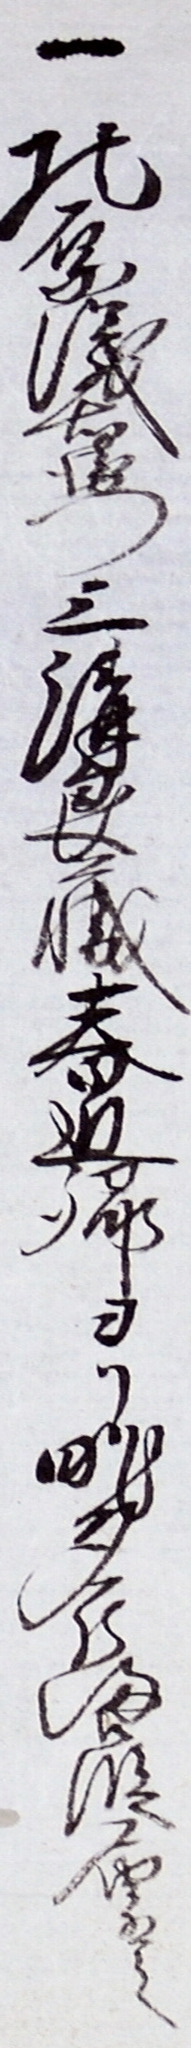一北原儀右衛門三溝良蔵春近郷ヨリ昨夕方罷帰候様届有之
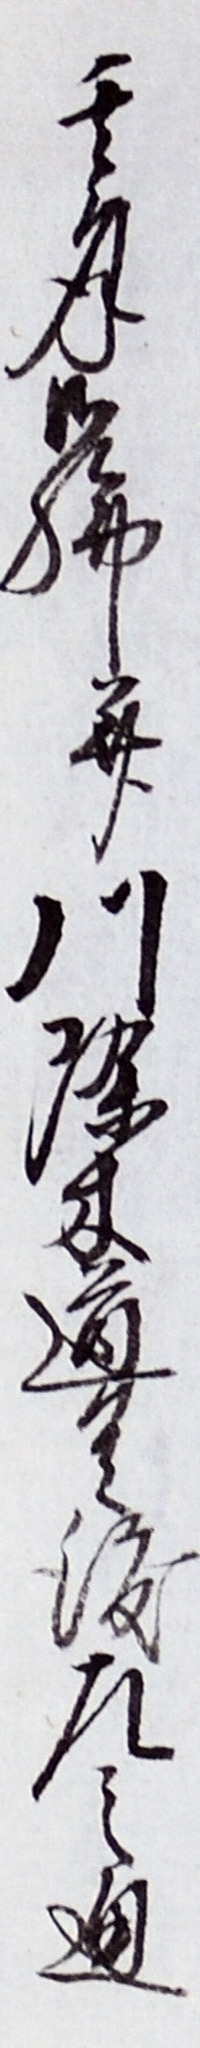其外御払并川除木道具渡左之通
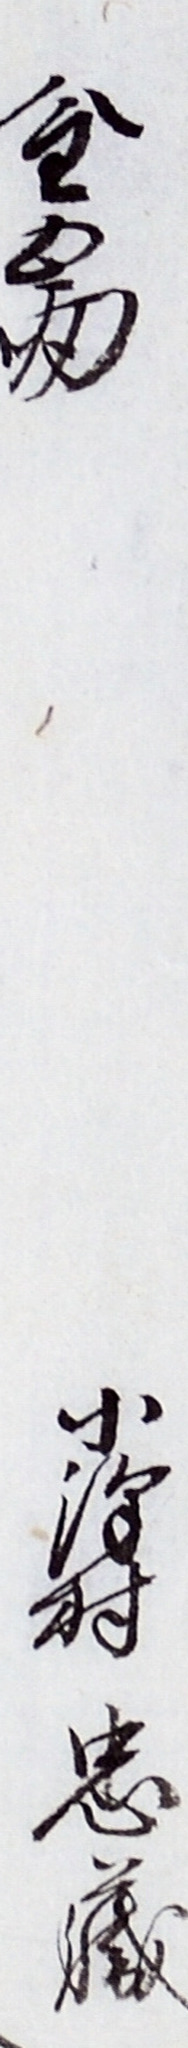金五両小澤村忠蔵
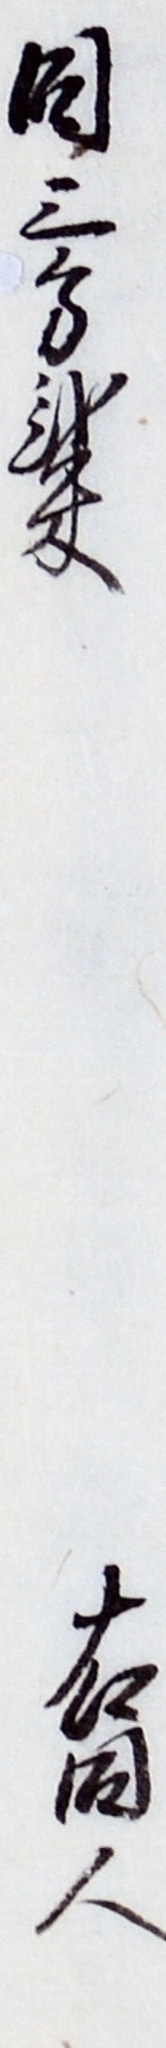同三分弐朱源右衛門
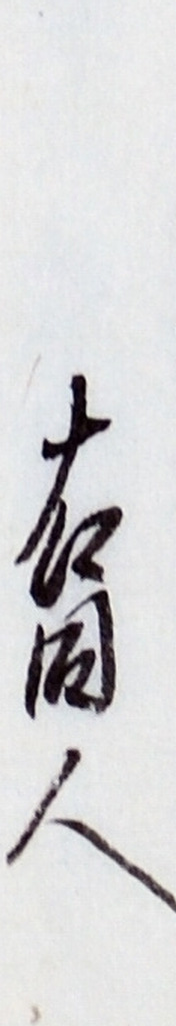右同人
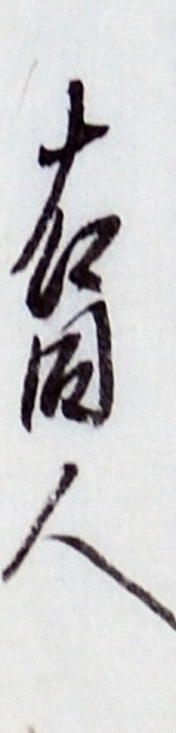右同人
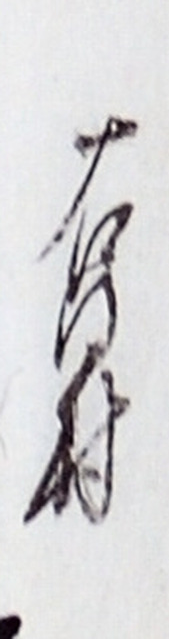右同村
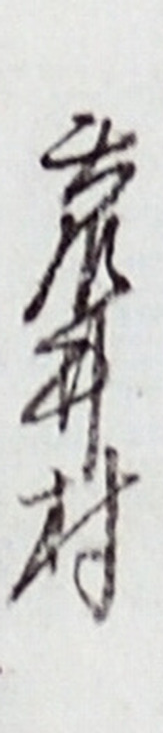荒井村
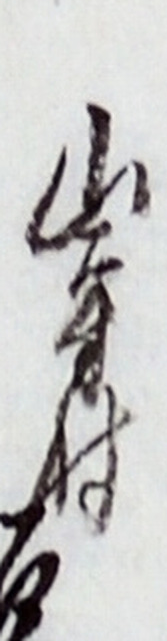山寺村
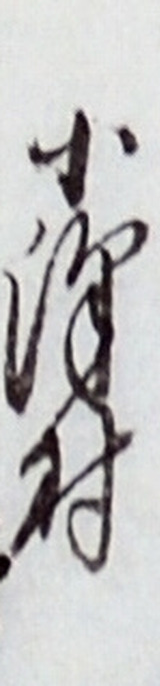小澤村
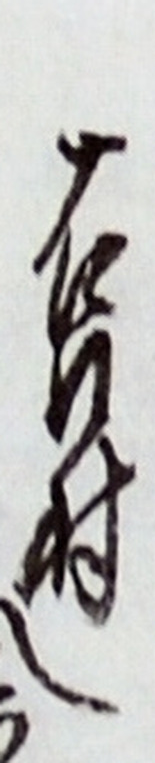右同村
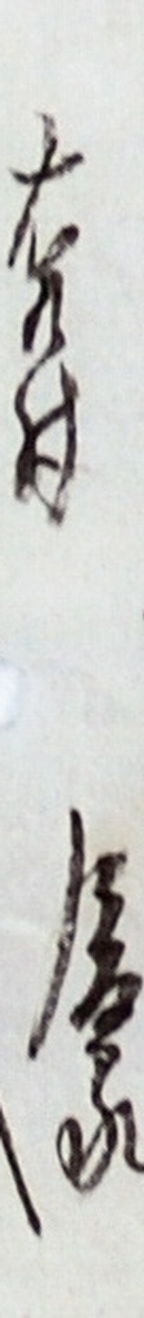右同村
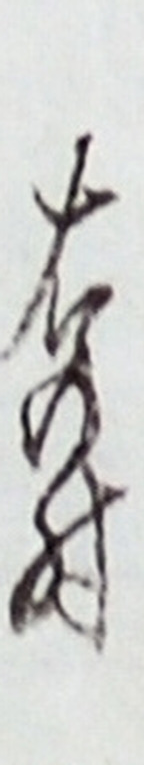右同村

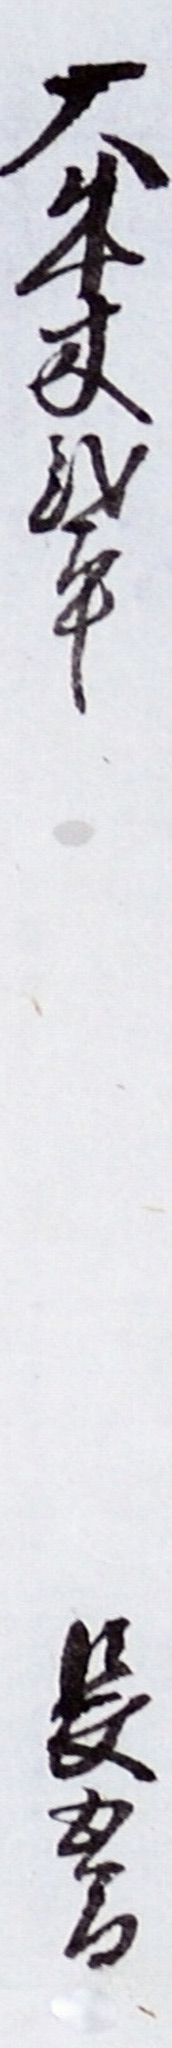大牛木弐本長五間
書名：御山奉行御用控
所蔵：伊那市立高遠町図書館・合同会社AMANE
